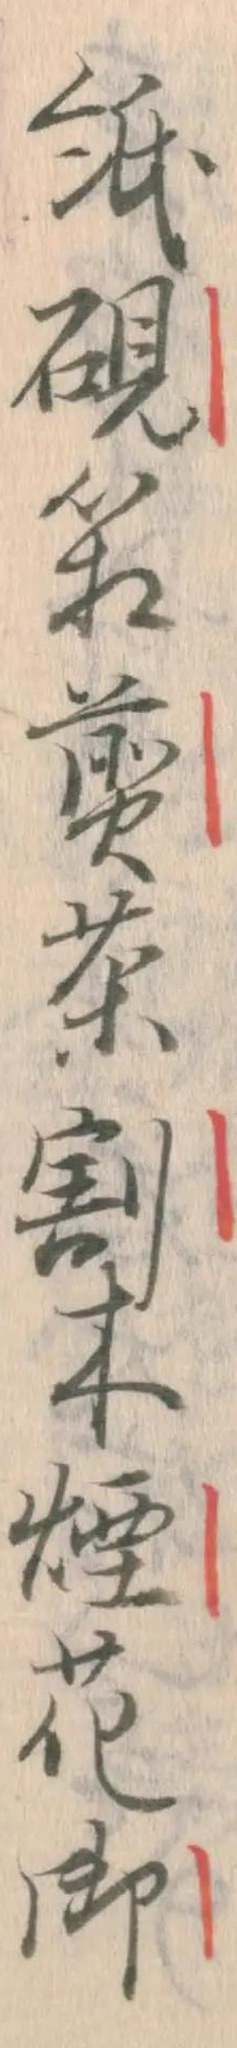紙硯箱煎茶割木煙花御
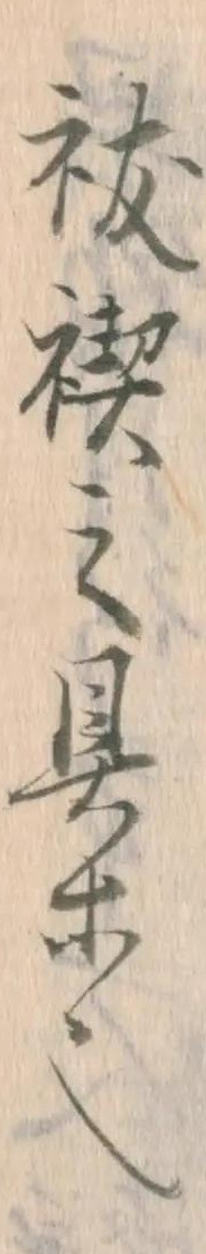祓禊之具等也
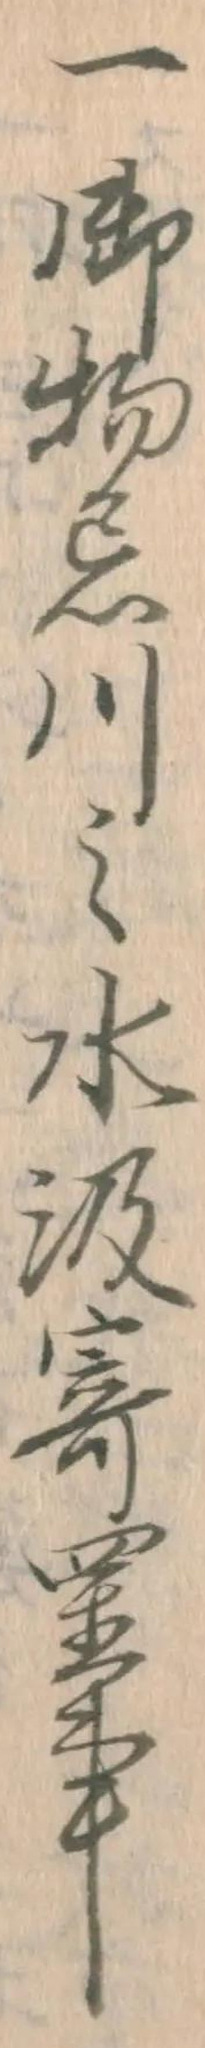一御物忌川之水汲寄置事
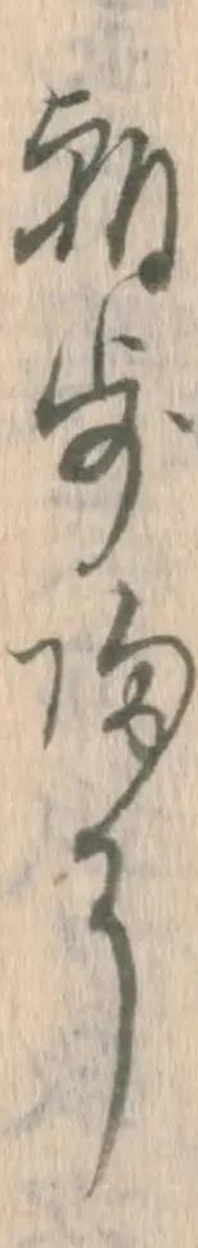朝歩帰了
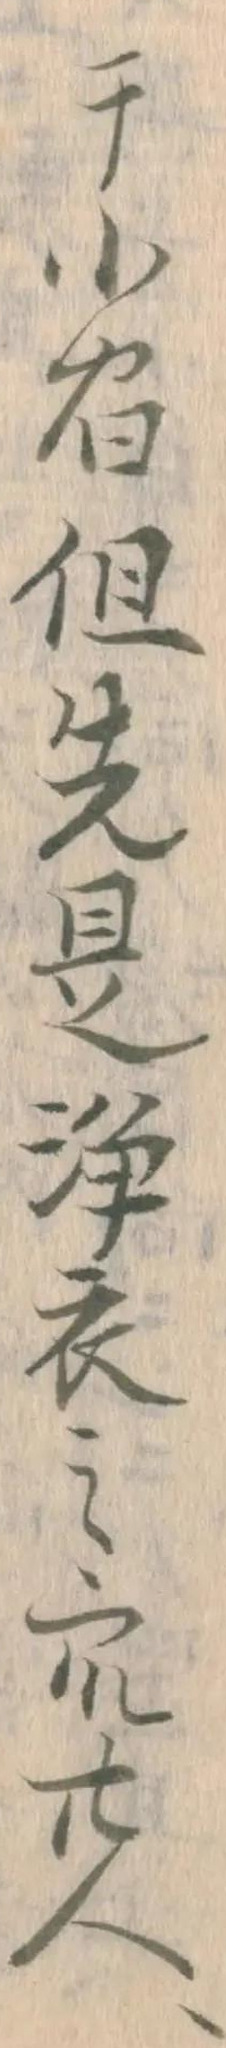于小宿但先是浄衣之衆廿人へ
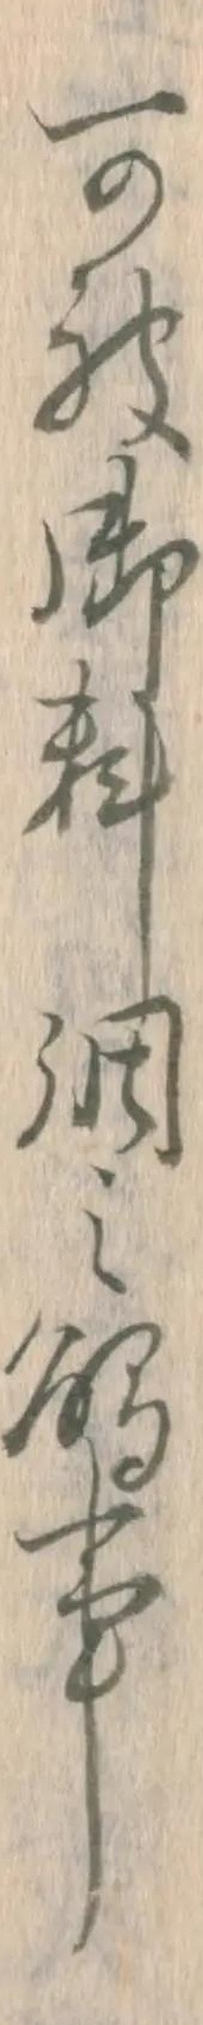可被御料調之触事
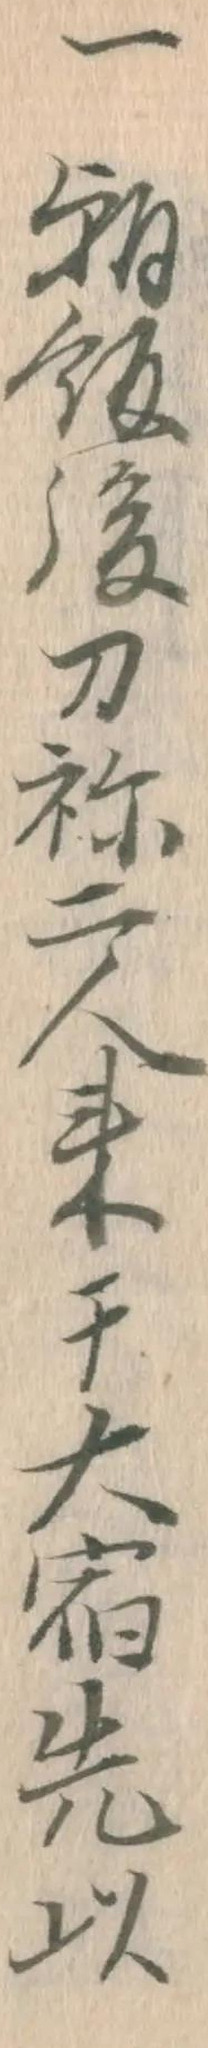一朝飯後刀祢二人来于大宿先以
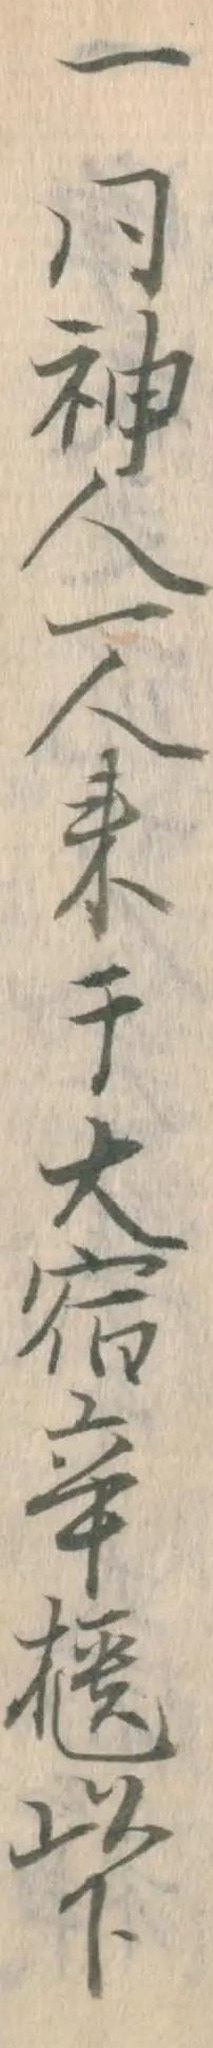一同神人一人来于大宿辛櫃以下
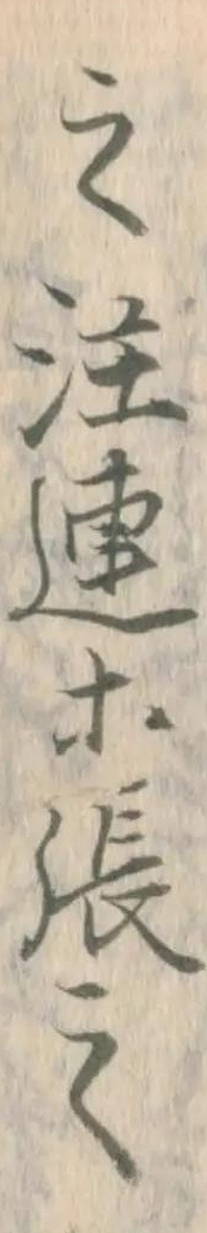之注連等張之

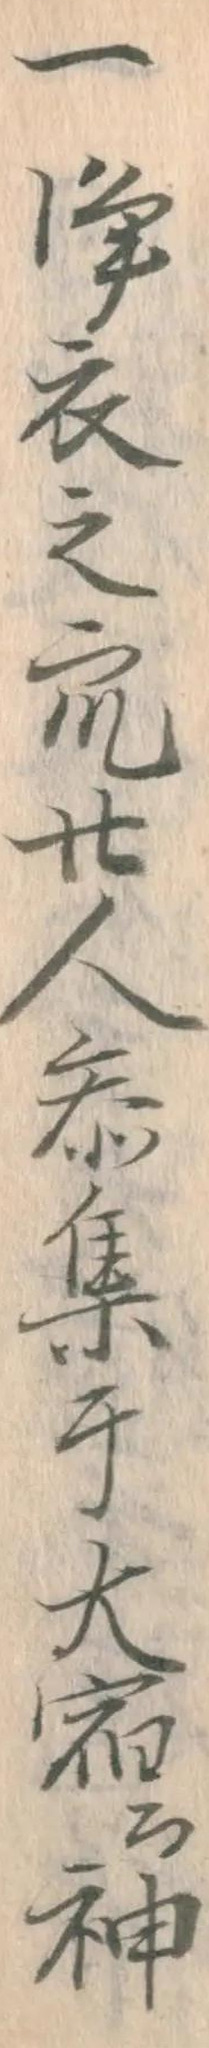一浄衣之衆廿人参集于大宿而神
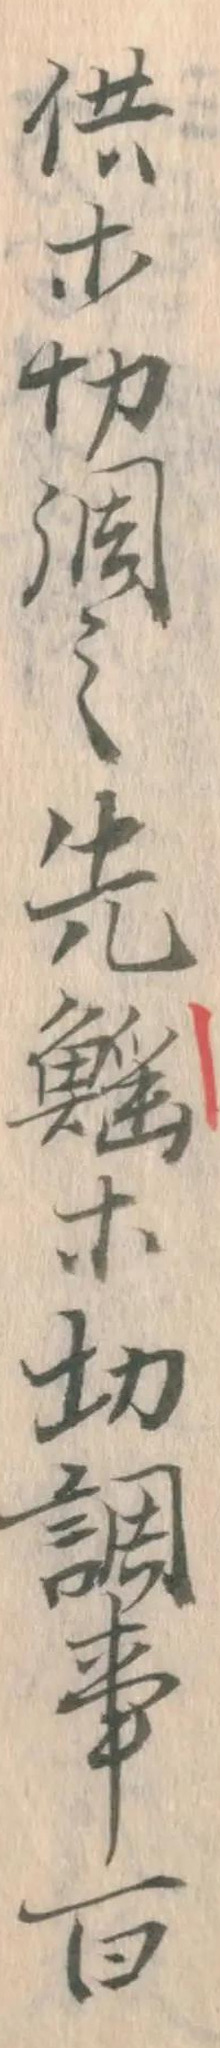供等切調之先鰹等切調事百
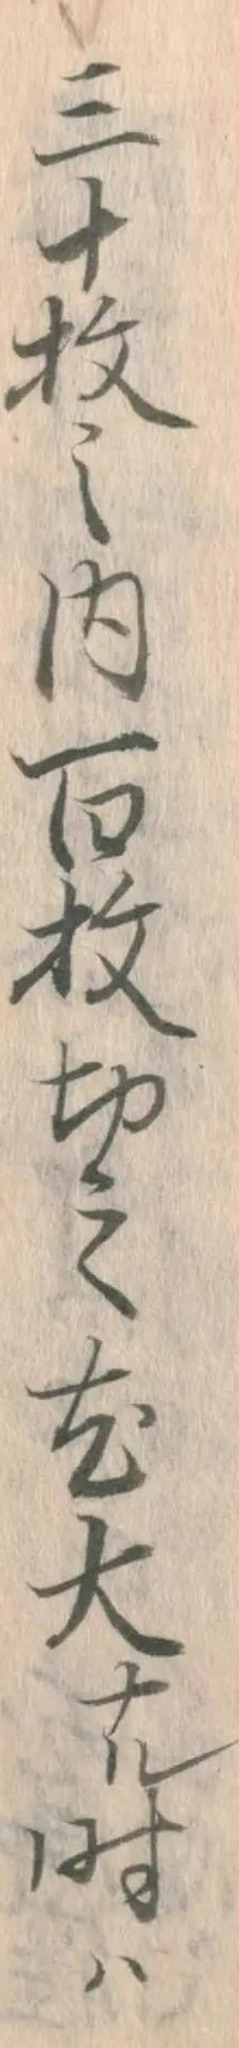三十枚之内百枚切之尤大ナル時は
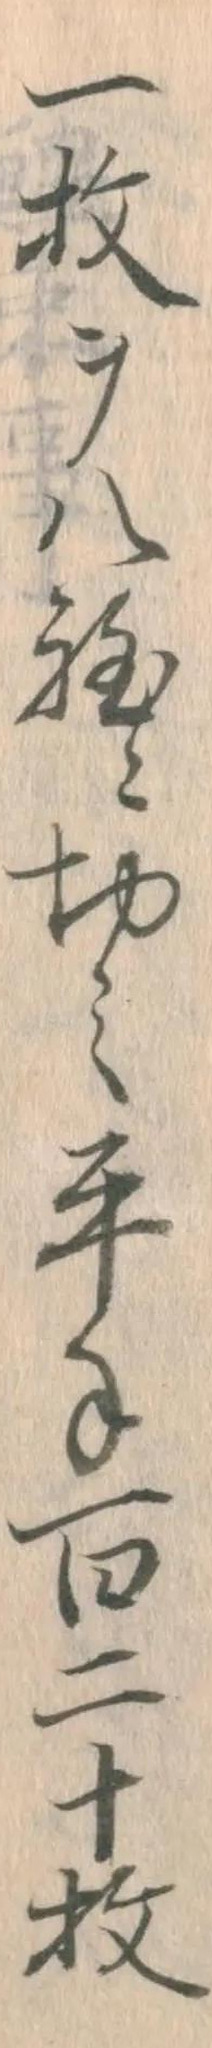一枚ヲ八程に切之平手百二十枚
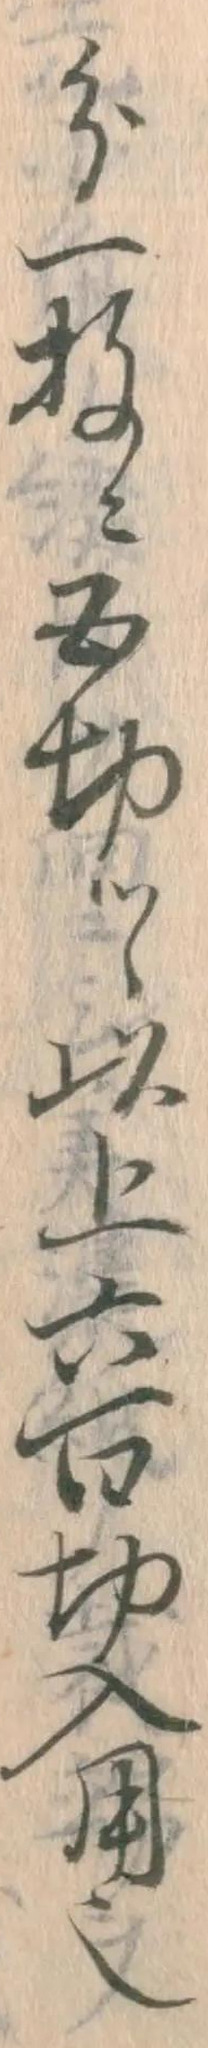分一枚に五切ツヽ以上六百切入用也
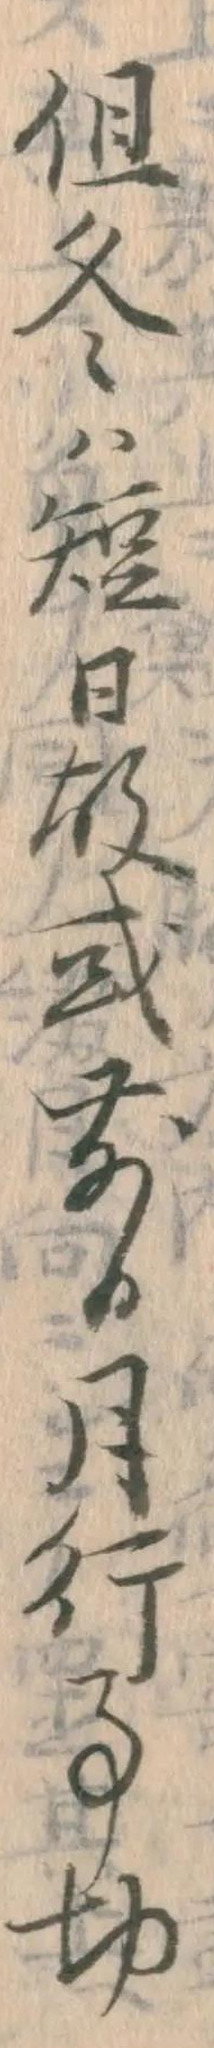但冬は短日故或前日月行事切
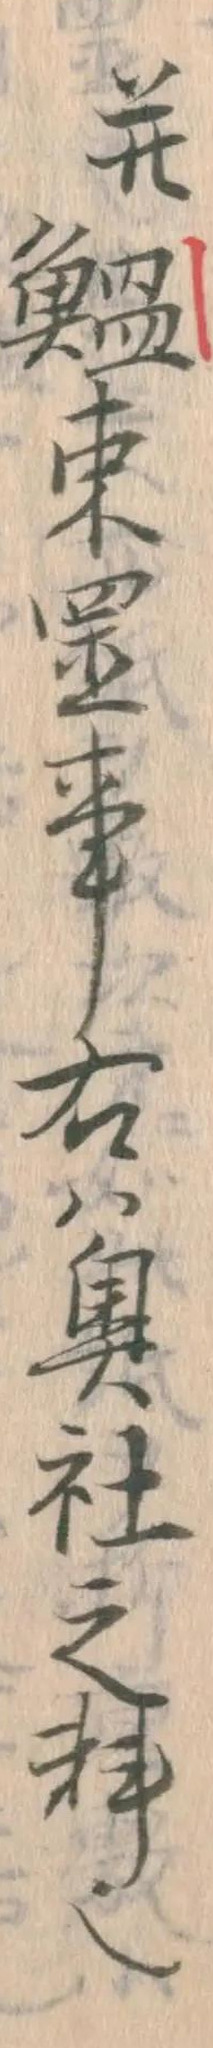并鰛束置事右は奥社之料也
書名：賀茂社記録. 第81冊
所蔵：国立国会図書館 National Diet Library, JAPAN
